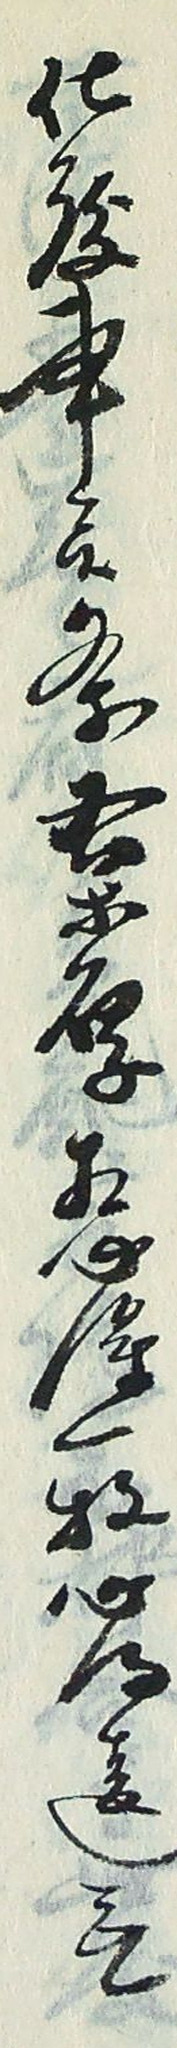仕度事ニ候条右等厚相心得一牧心得違無
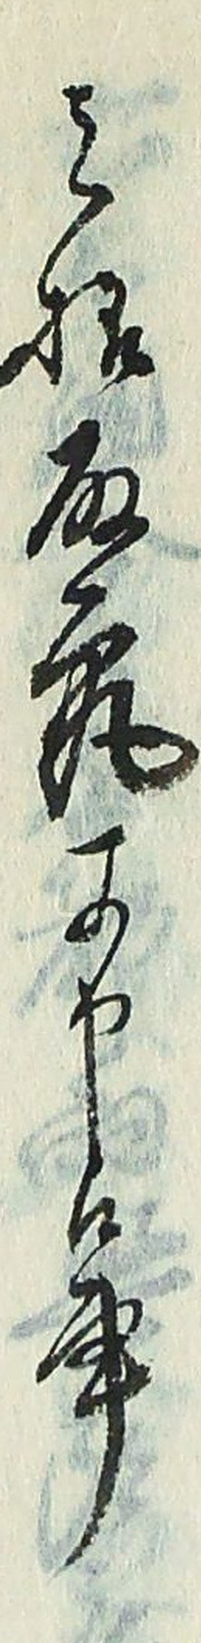之様取究可申候事
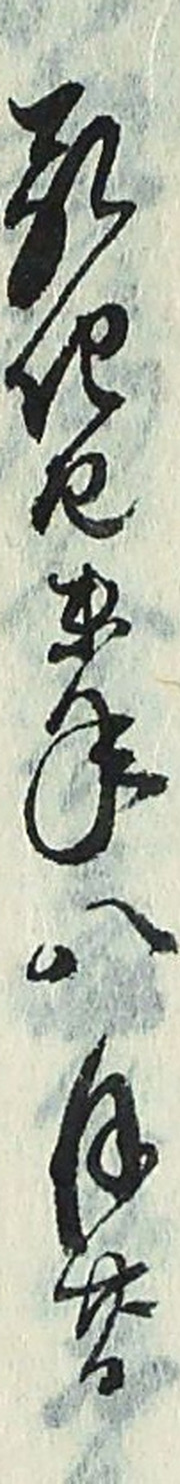弘化四未年八月廿日
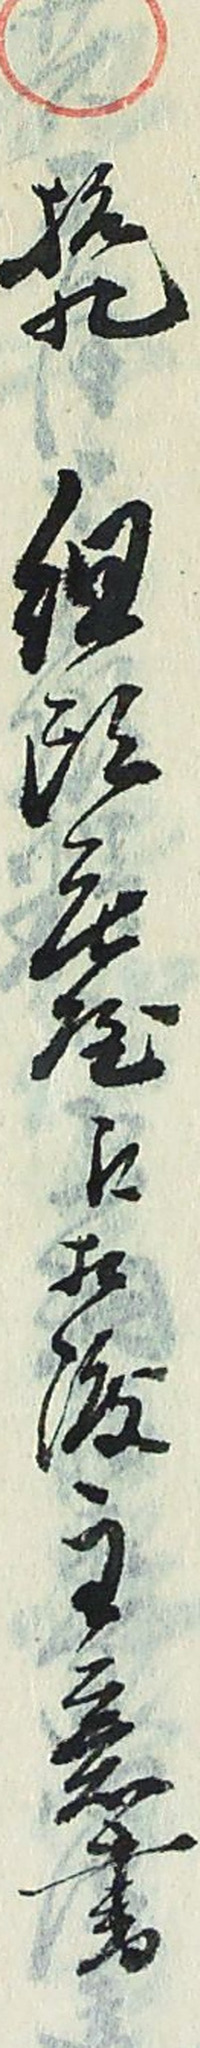○拾九組頭庄屋江相渡主意書
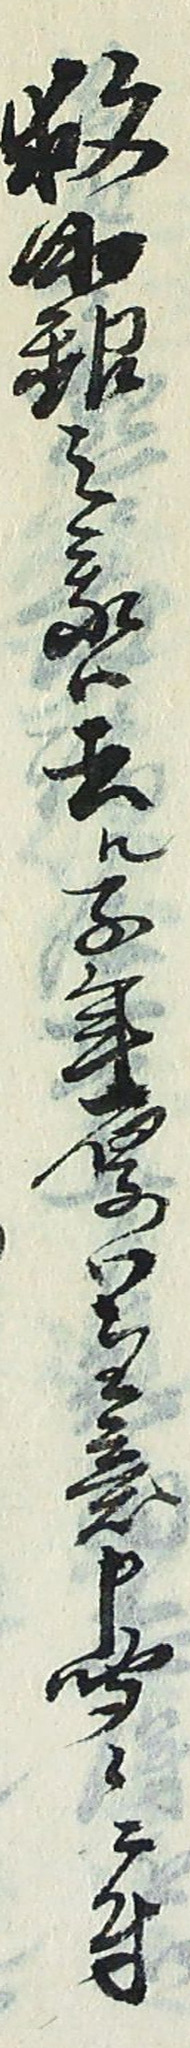救助銀之義ハ去ル子年厚御主意申聞候ニ付
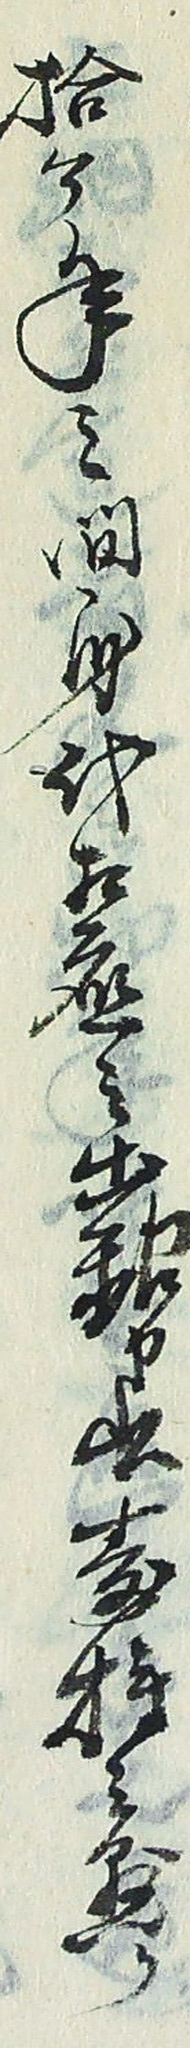拾ケ年之間身代相應之出銀申出候寄持之懸り
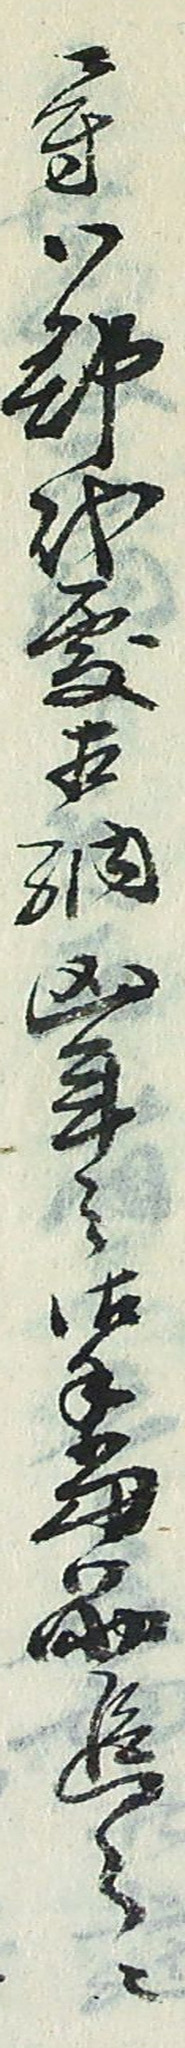ニ付御郡代處相納凶年之御手當筋追々ニ
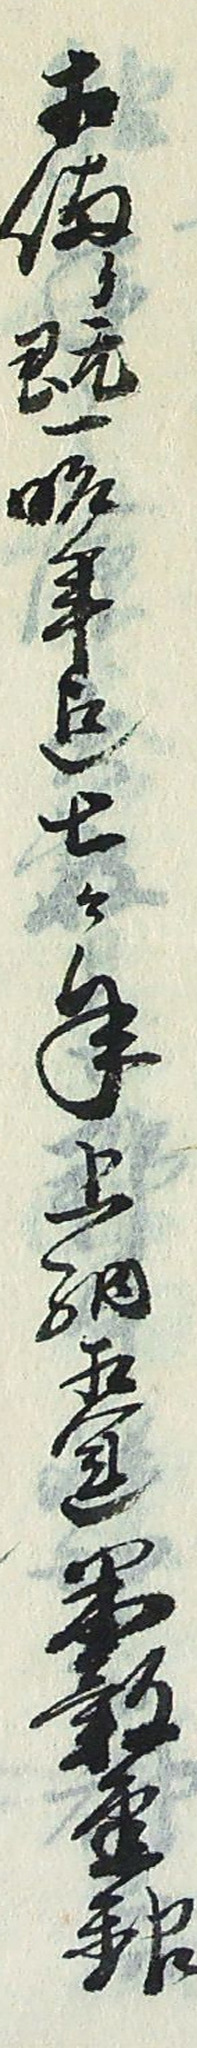相備り既一昨年迄七ケ年上納相運米穀金銀
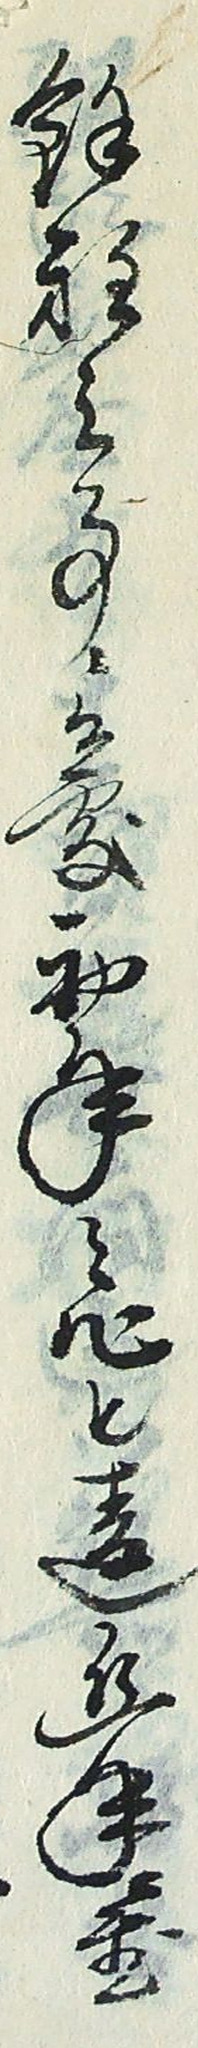餘程之事ニ候處初年之心と違近年ニ至
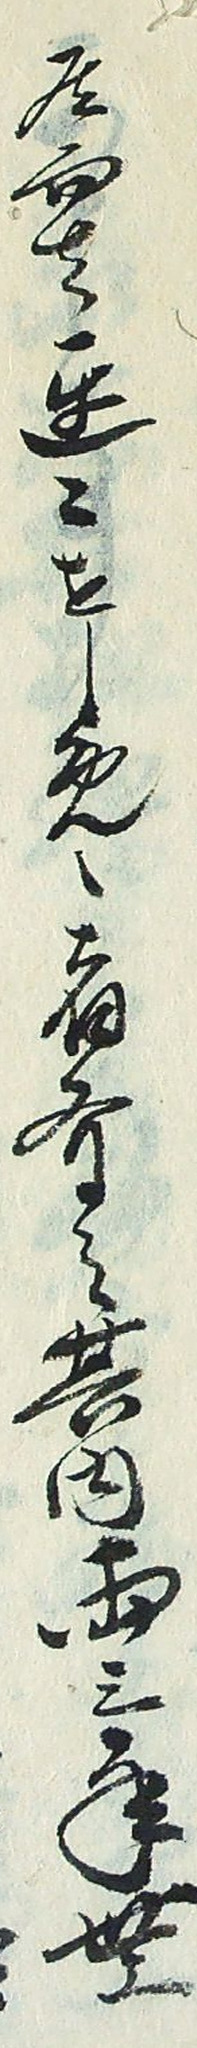候而者遅々せしめ候者有之其内両三年世上
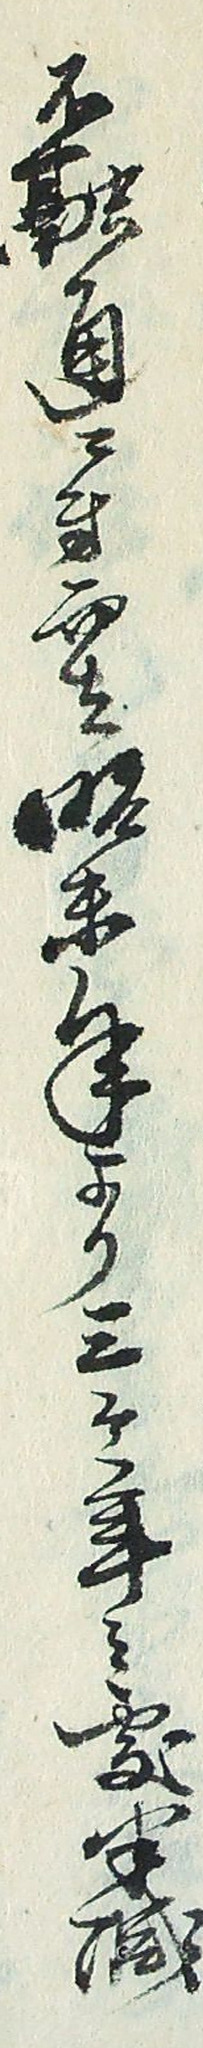不融通ニ付而者昨未年より三ケ年之處半減
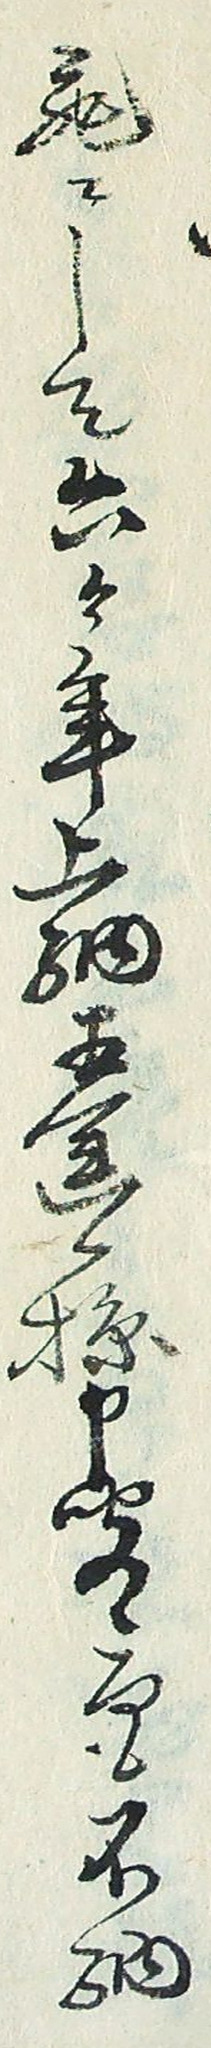宛ニして六ケ年上納相運候様申聞候而も不納

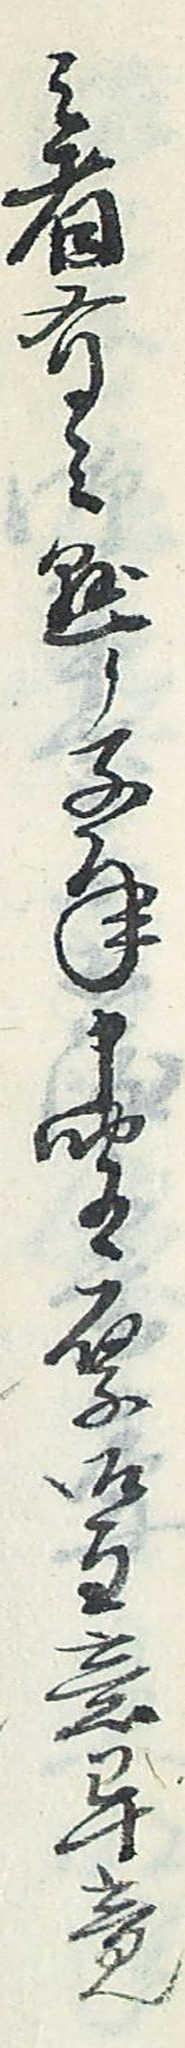之者有之懸り子年申聞候厚御主意畢竟
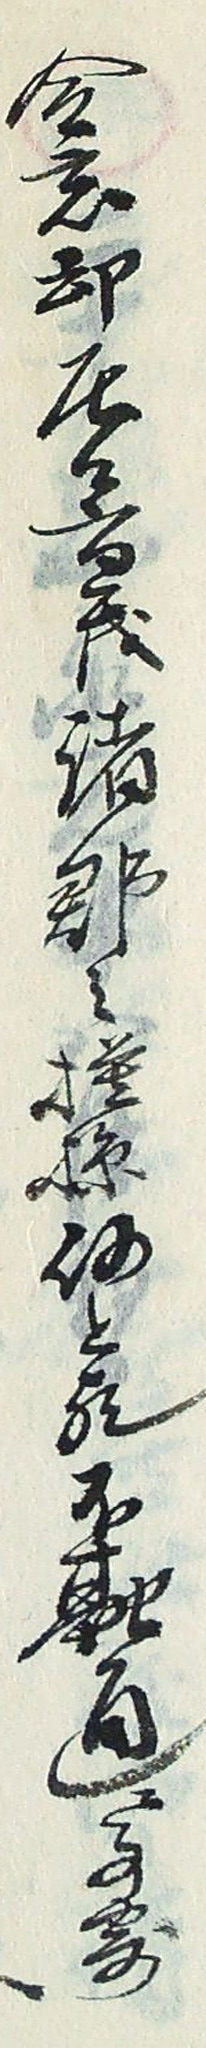令忘却居候旨も諸郡之模様何と欤不融通ニ事寄
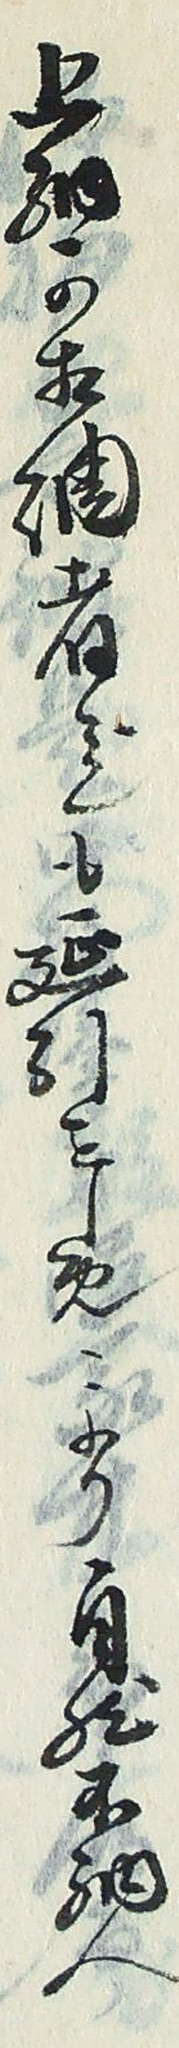上納可相調者迄も延引せしめ候より自然不納人
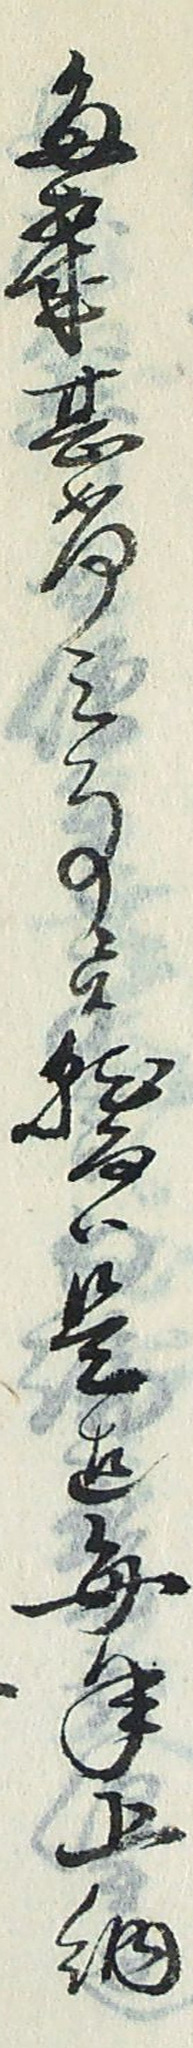多相成甚如何之事ニ候就而ハ是迄毎年上納
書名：諸御趣意書并御下知向之写
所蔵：鳴門教育大学 Naruto University of Education
